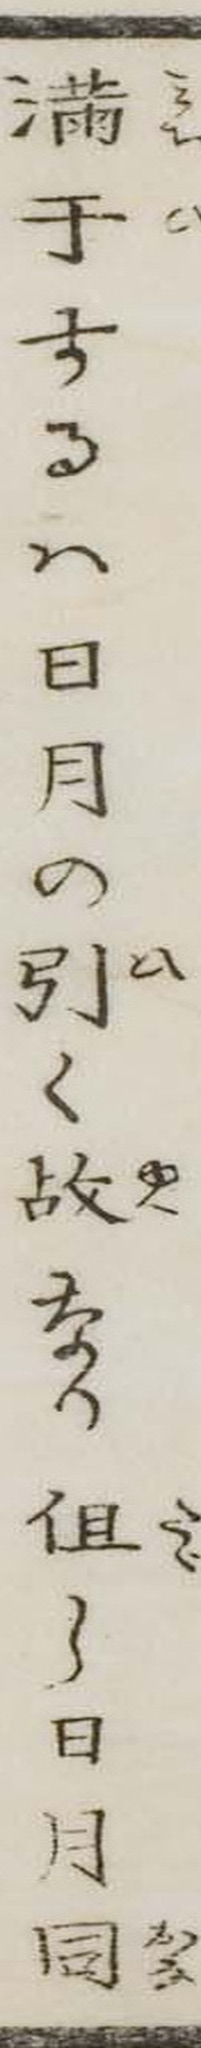満干するは日月の引く故なり但し日月同
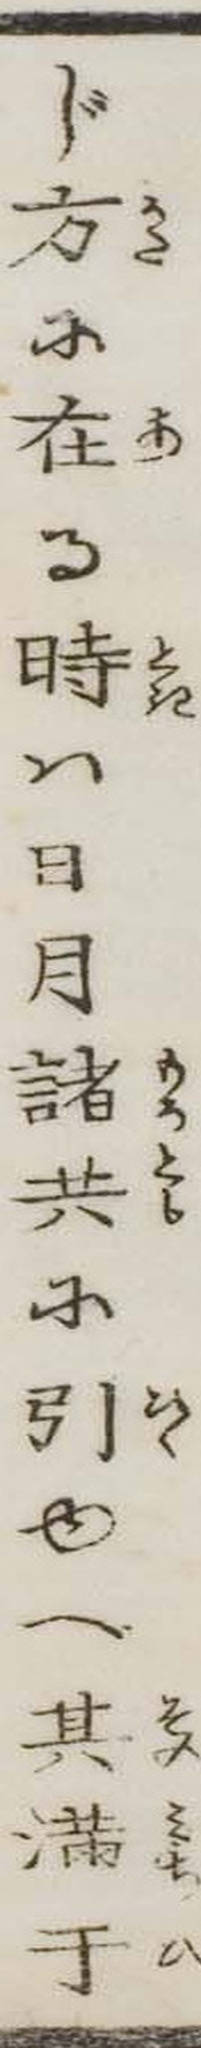じ方に在る時は日月諸共に引ゆへ其満干
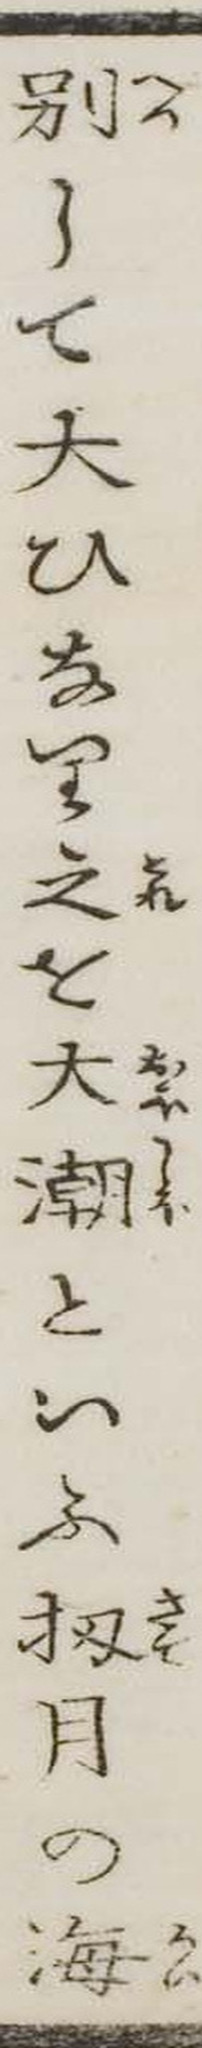別して大ひなり之を大潮といふ扨月の海
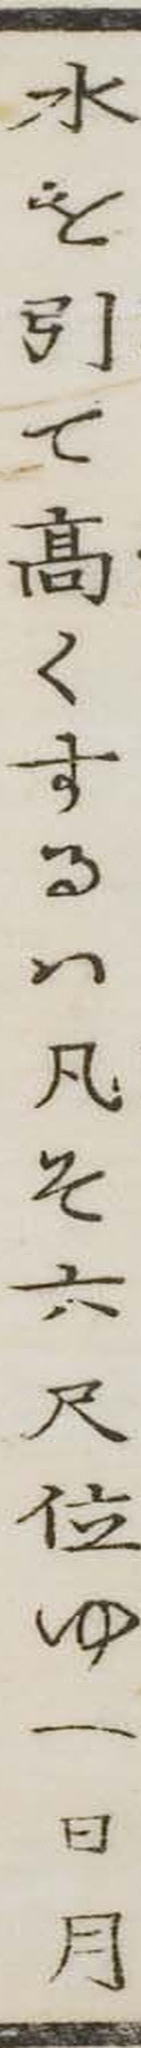水を引て髙くするは凡そ六尺位ゆへ日月
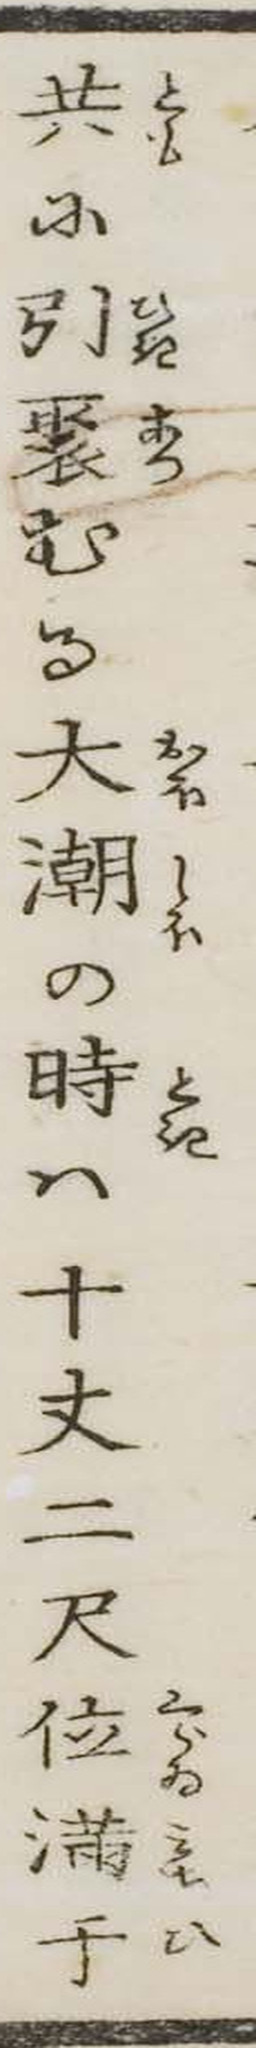共に引聚むる大潮の時は十丈二尺位満干
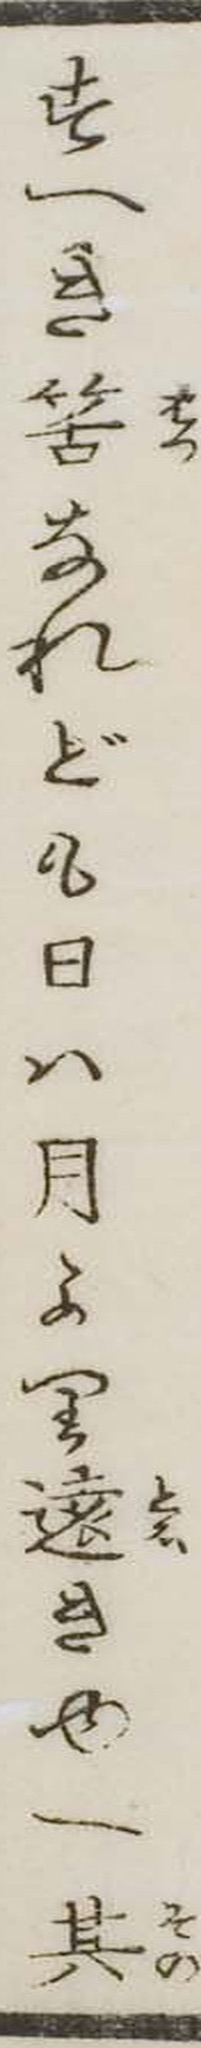すへき筈なれども日は月より遠きゆへ其
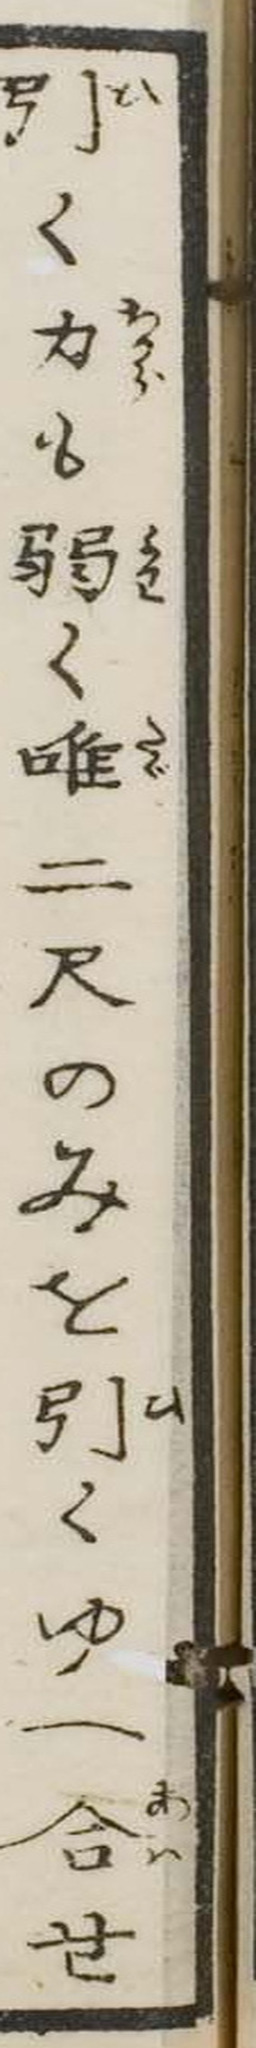引く力も弱く唯二尺のみを引くゆへ合せ
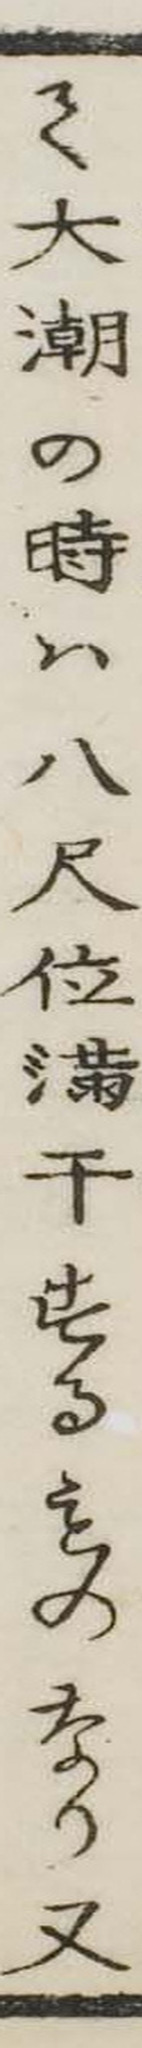て大潮の時は八尺くらい満干するものなり又
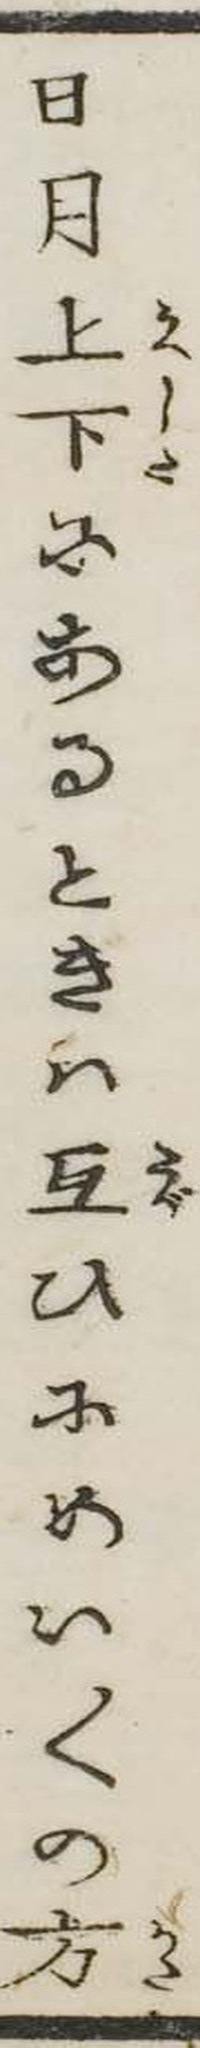日月上下にあるときは互ひにめい〳〵の方
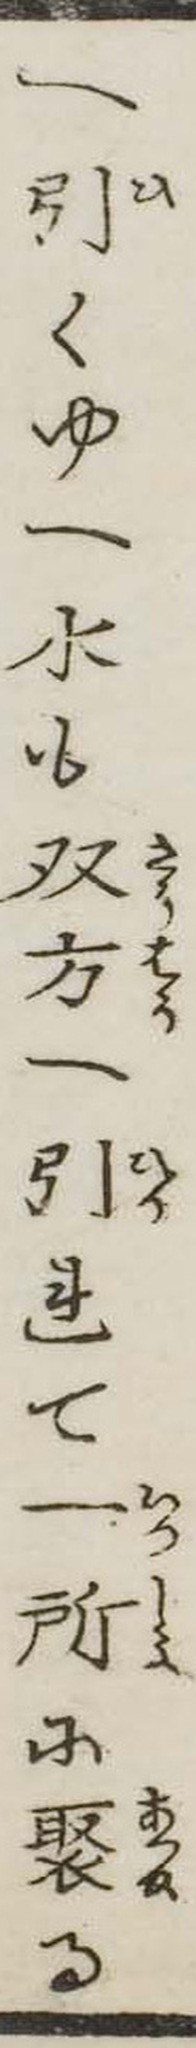へ引くゆへ水も双方へ引れて一所に聚る
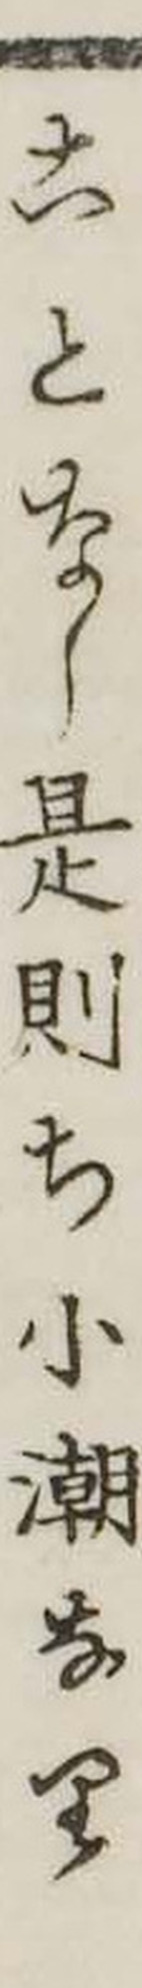ことなし是則ち小潮なり
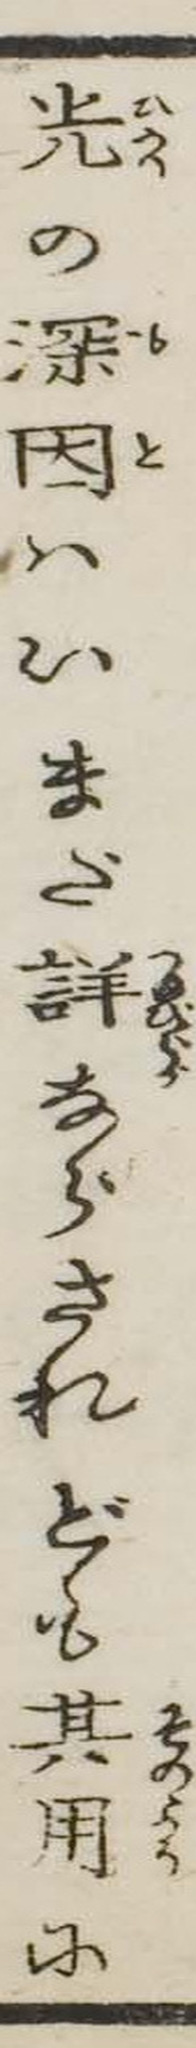光の深因はいまだ詳ならされども其用に
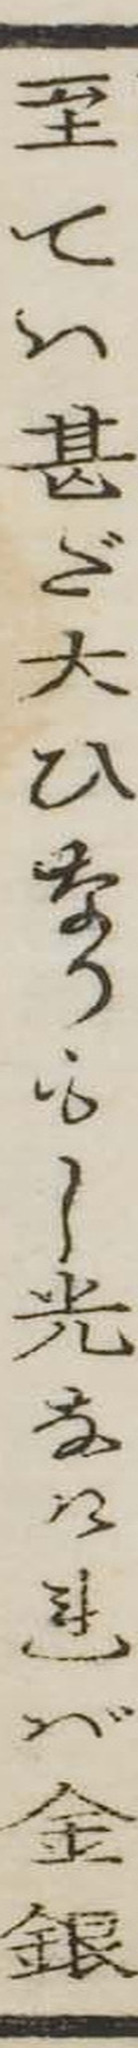至ては甚だ大ひなりもし光なければ金銀

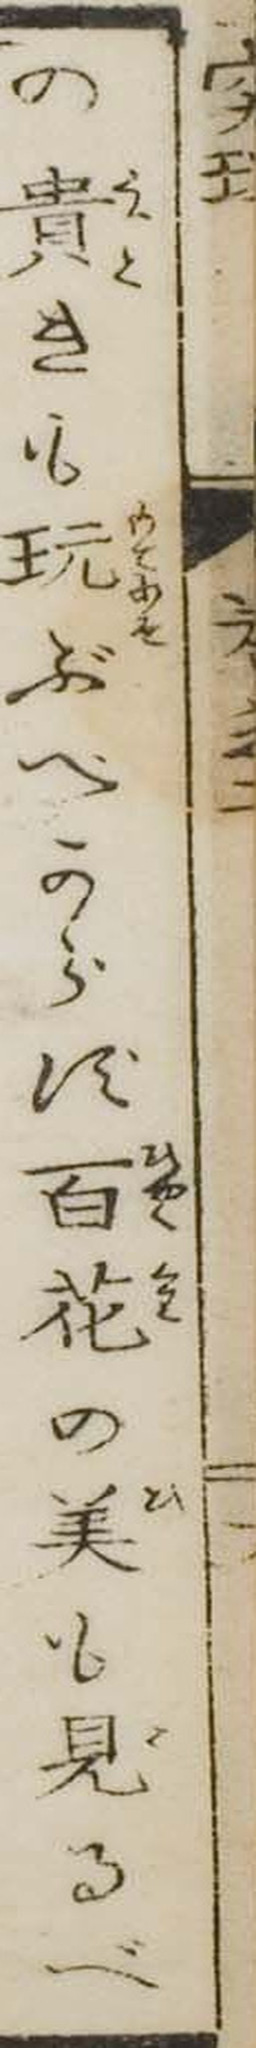の貴きも玩ぶべからず百花の美も見るべ
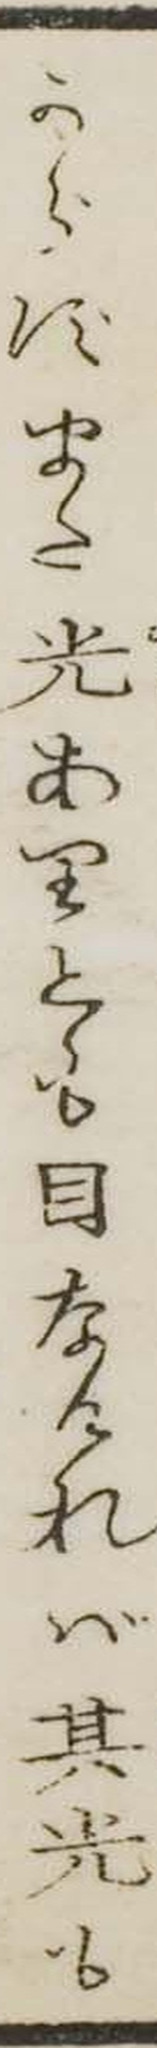からずまた光ありとも目なければ其光も
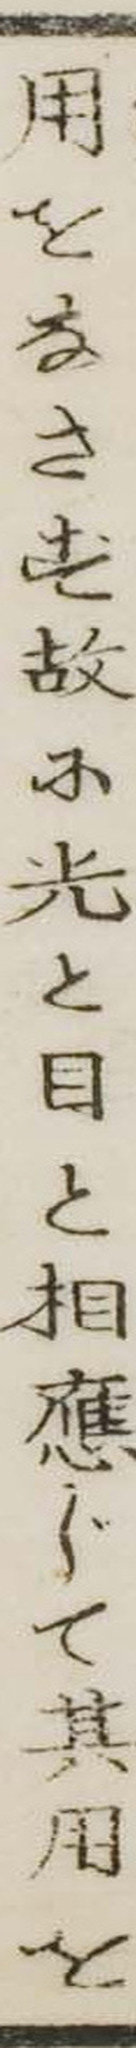用をなさず故に光と目と相應じて其用を
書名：究理知慧の勧 : 訓蒙画入 巻之2
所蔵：東京学芸大学附属図書館
